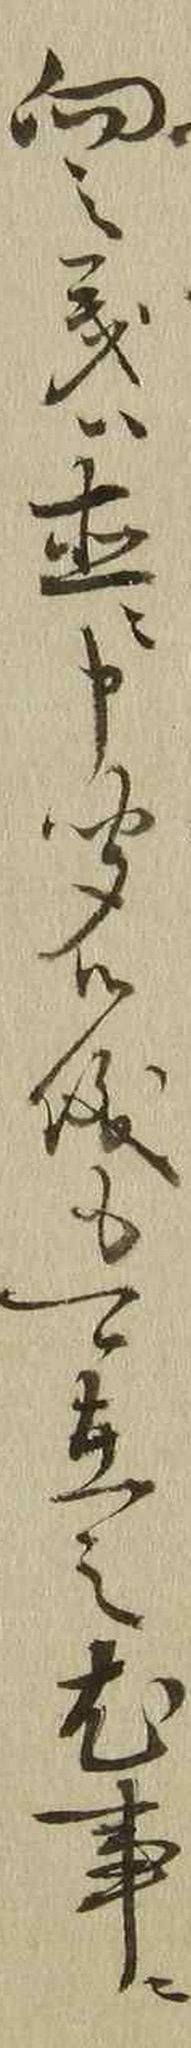向之義ハ直ニ申聞候儀も可在之尤事ニ
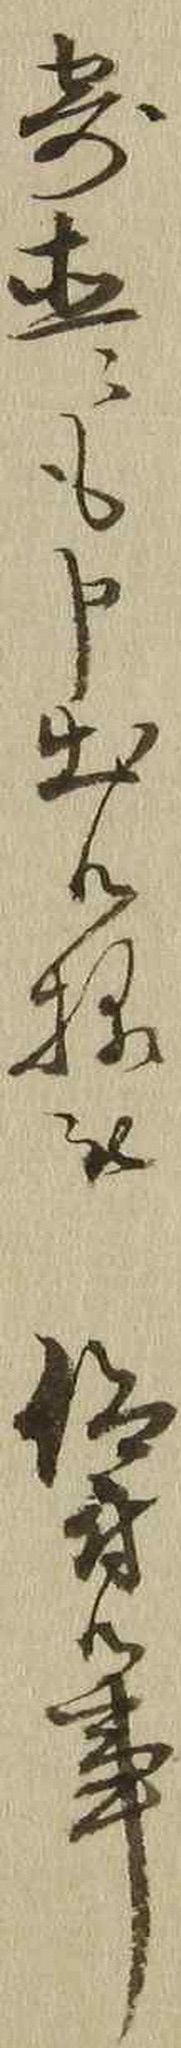寄直ニも申出候様被仰付候事
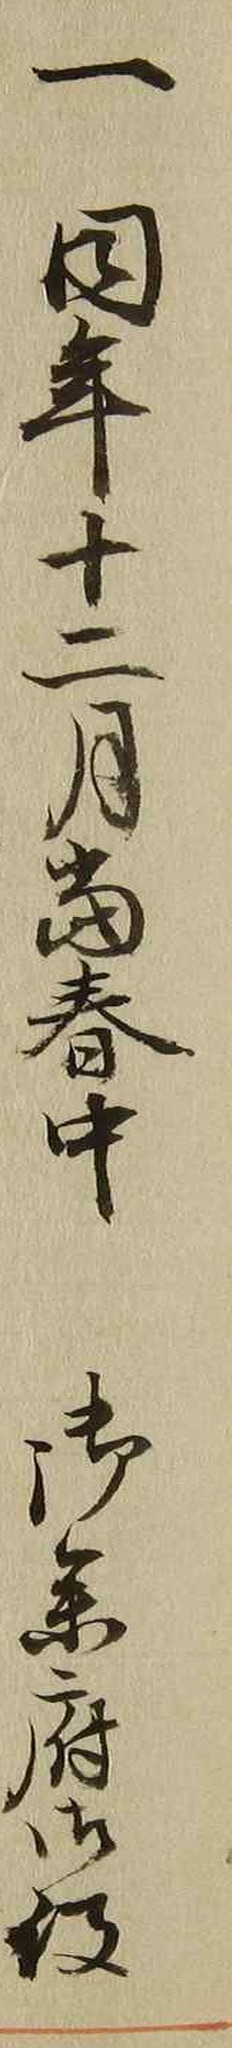一同年十二月当春中御参府御役
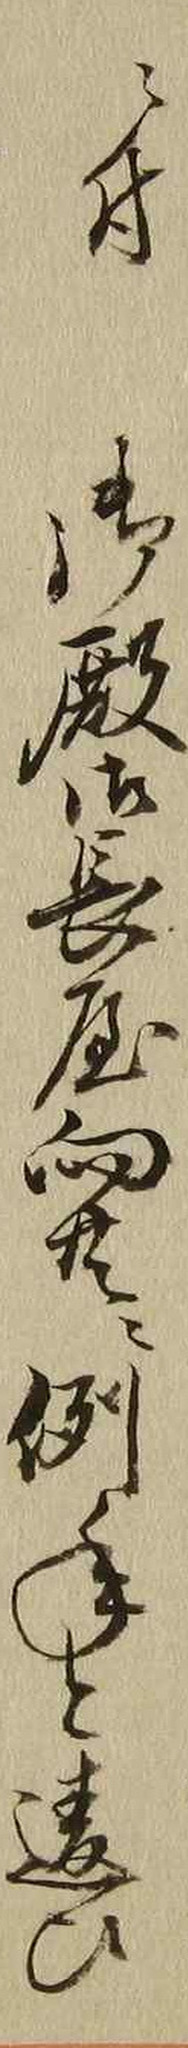ニ付御殿御長屋向共ニ例年と違ひ
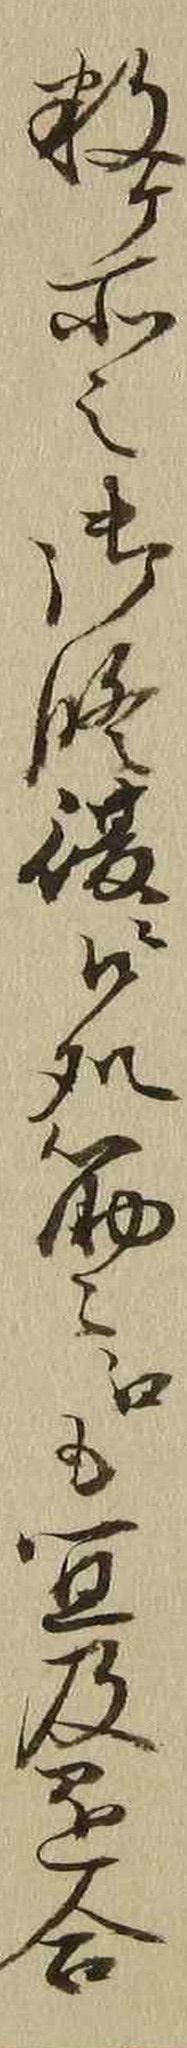数ヶ所之修復ニ候処筋々江も宣及懸合
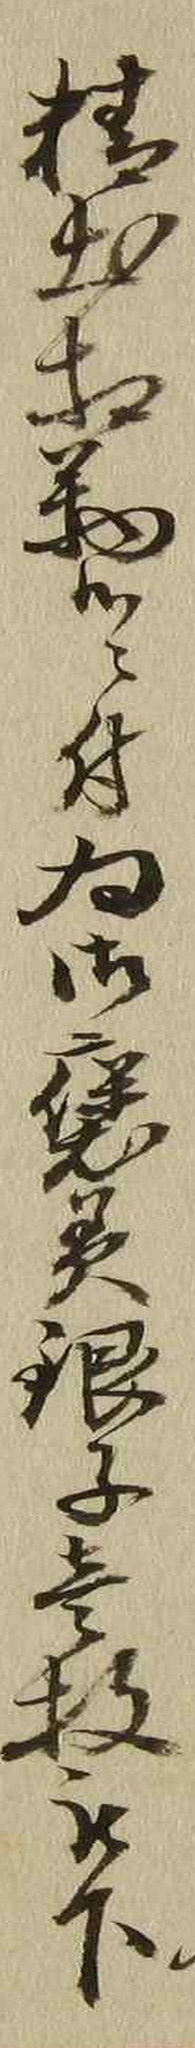精出相勤候ニ付為御褒美銀子壱枚被下
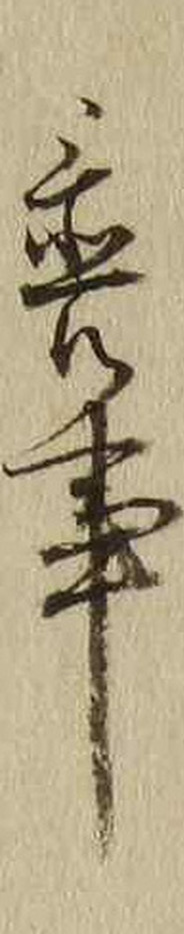置候事
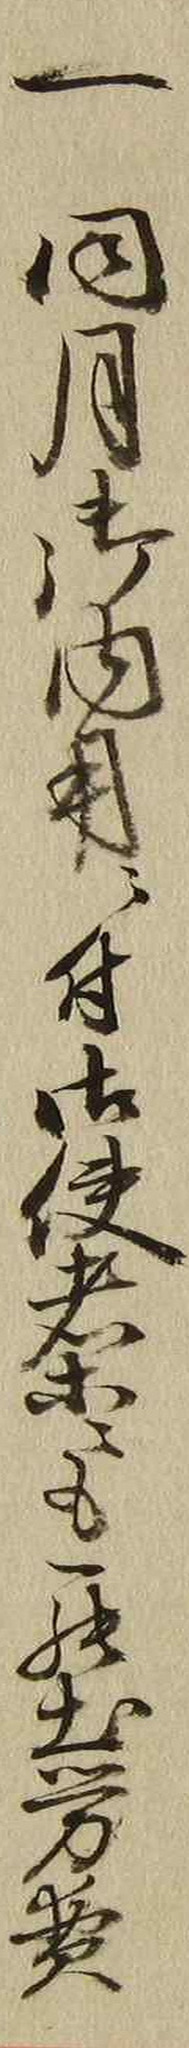一同月御内用ニ付御使者等ニも罷出労費
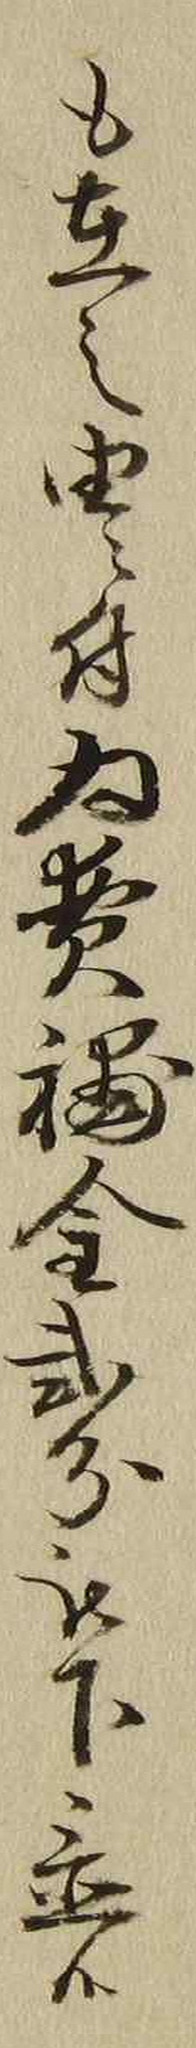も在之由ニ付為費補金弐分被下置候
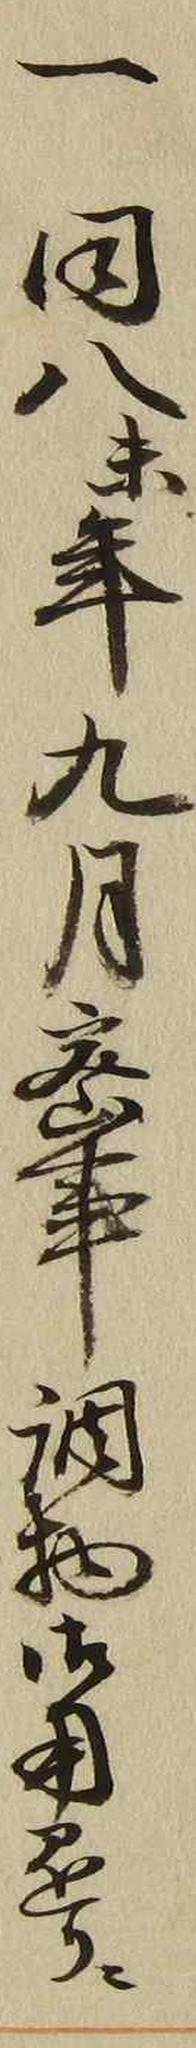一同八未年九月密事調物御用懸りニ
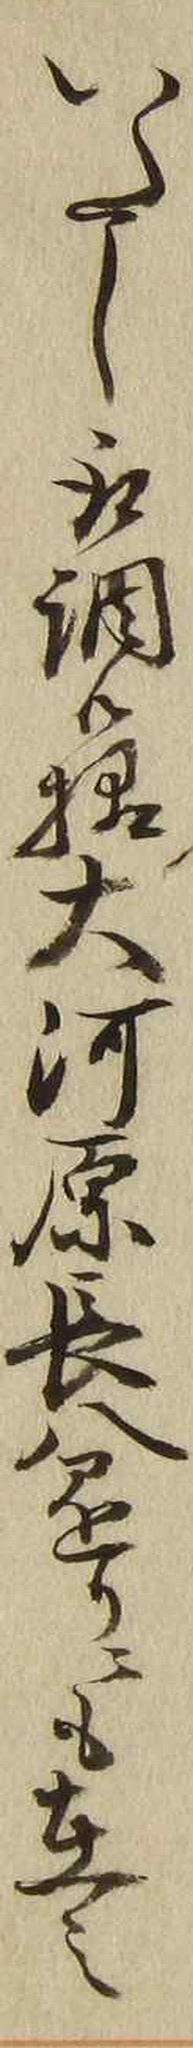いたし取調候様大河原長八懸りニも在之

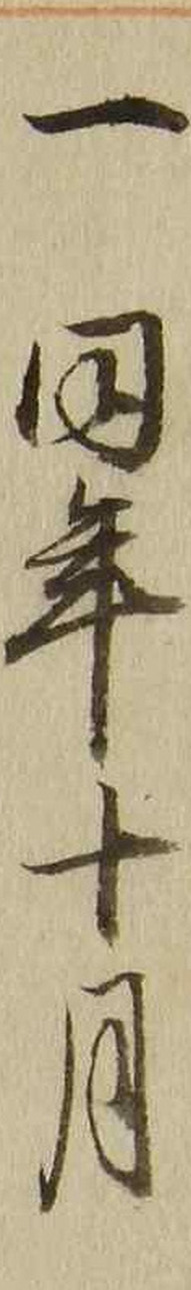一同年十月
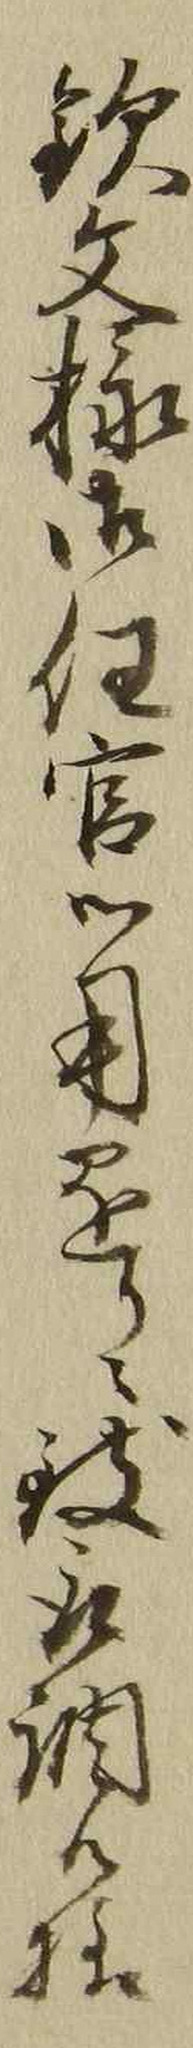欽文様御任官御用懸りニ致取調候様
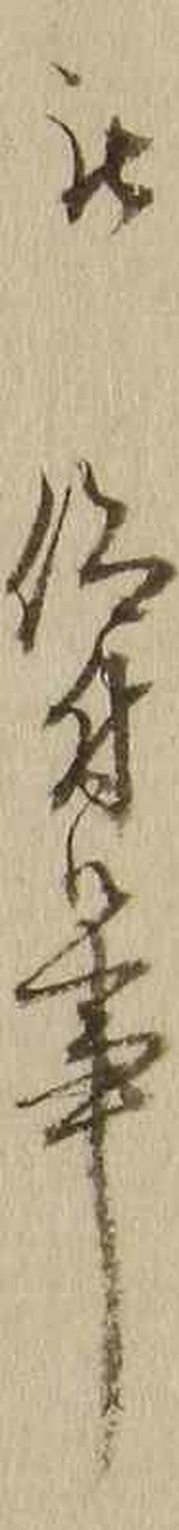被仰付候事
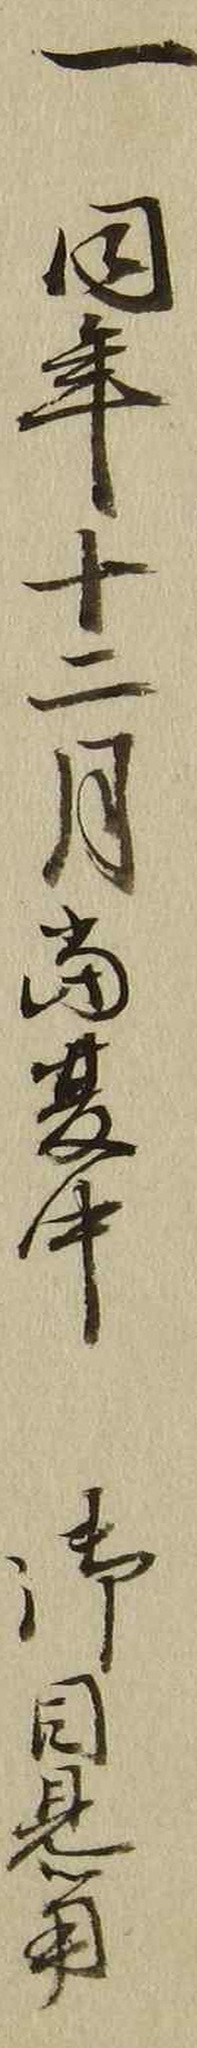一同年十二月当夏中御目見御用
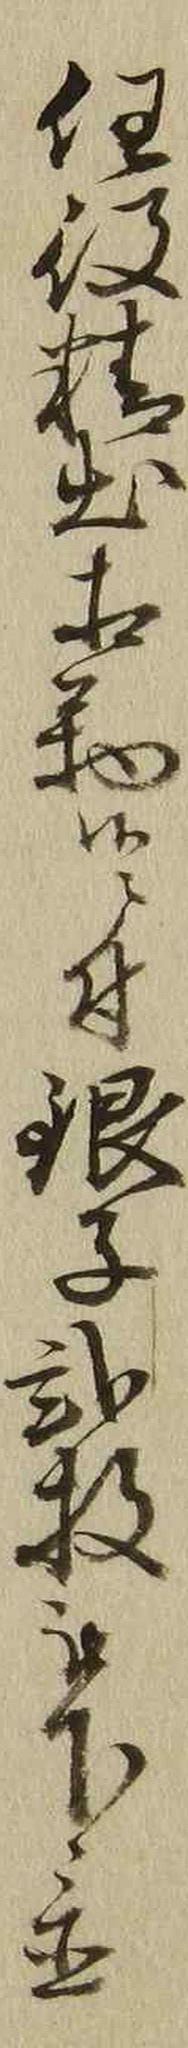任役精出相勤候ニ付銀子弐枚被下置
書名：諸士系譜　巻之64　と之部7
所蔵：会津若松市立会津図書館
